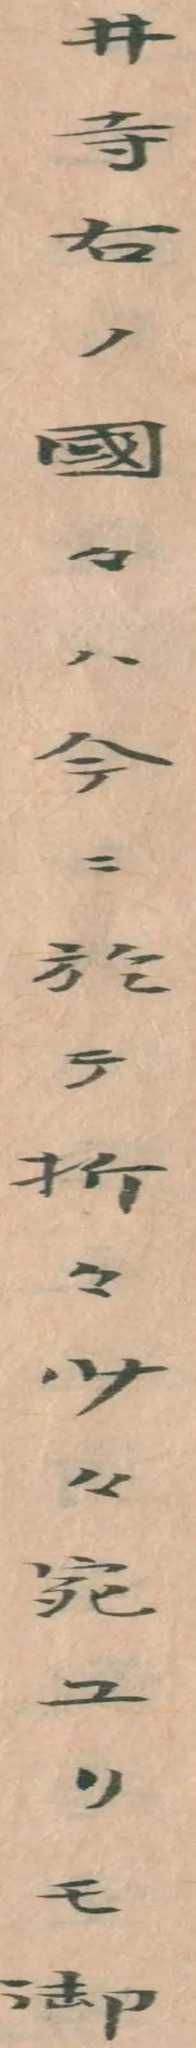井寺右ノ国々ハ今二於テ折々少々宛ユリモ御
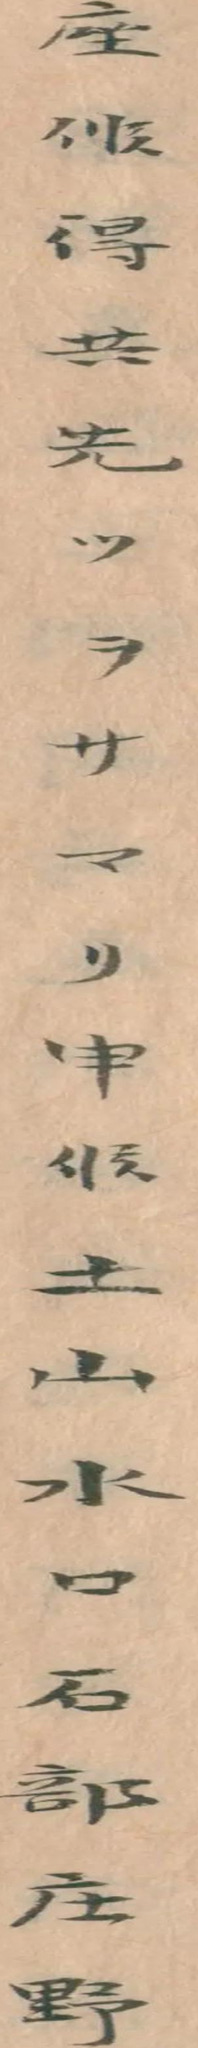座候得共先ツヲサマリ申候土山水口石部庄野

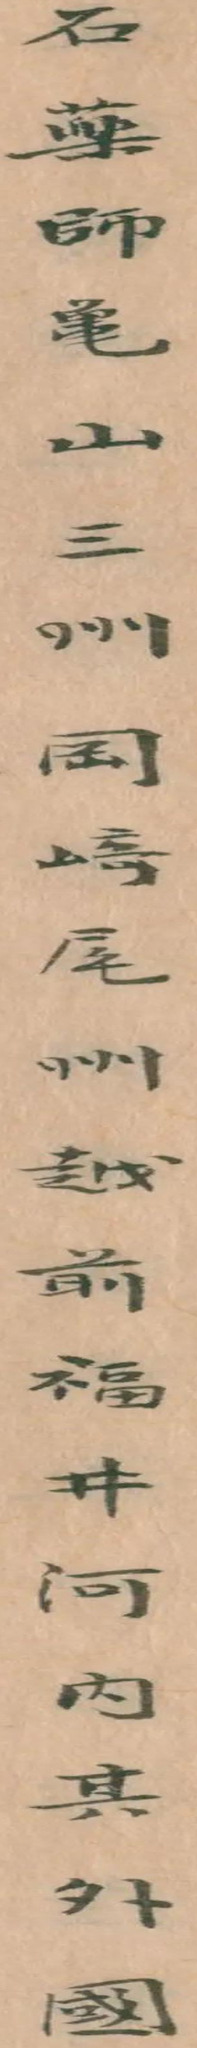石薬師亀山三州岡崎尾州越前福井河内其外国
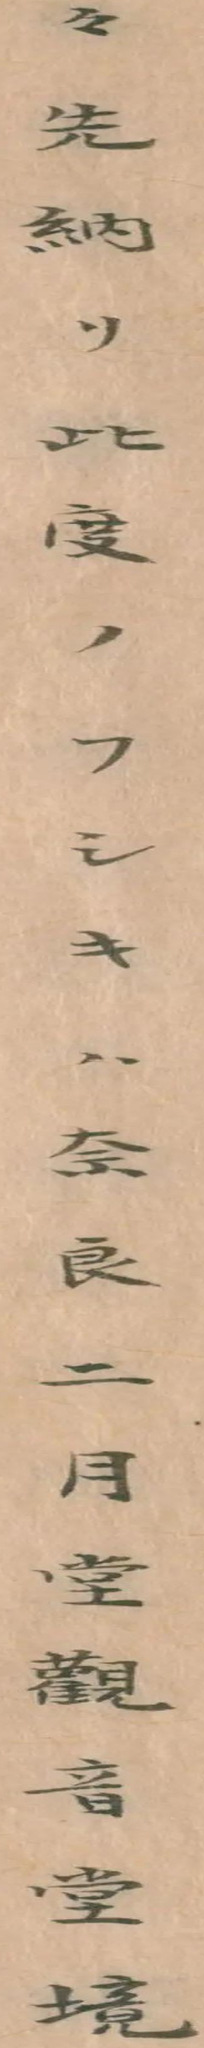々先納り此度ノフシキハ奈良二月堂観音堂境
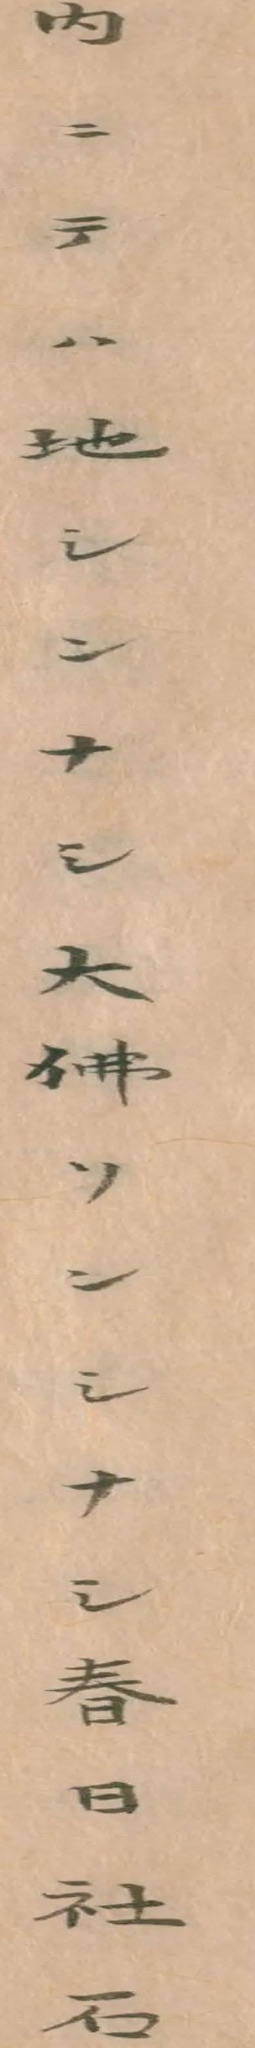内ニテハ地シンナシ大仏ソンシナシ春日社石
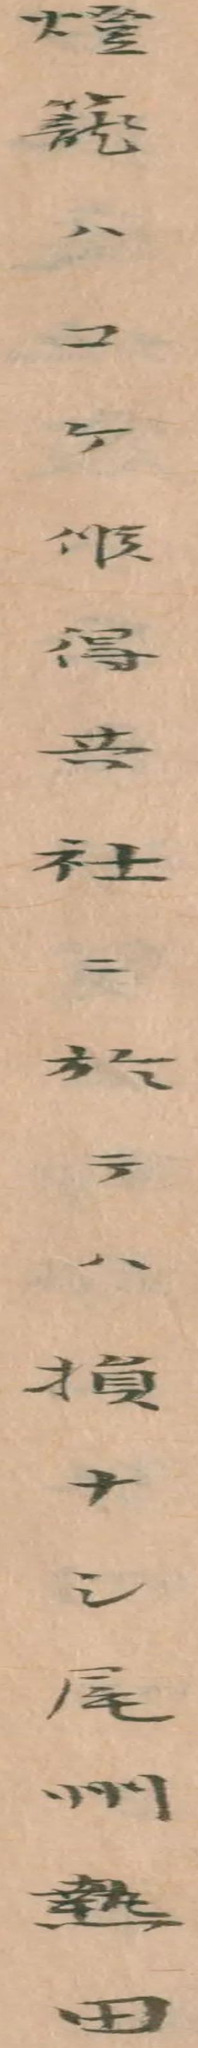燈籠ハコケ候得共社二於テハ損ナシ尾州熱田
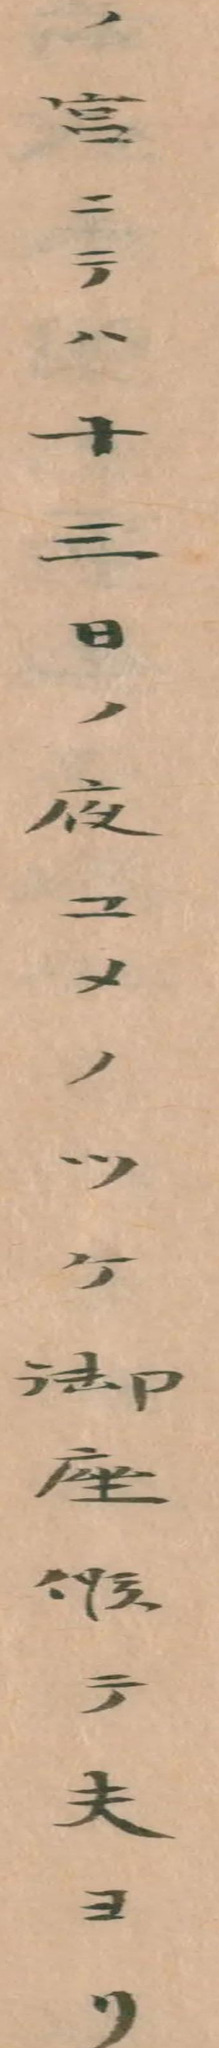ノ宮二テハ十三日ノ夜ユメノツケ御座候テ夫ヨリ
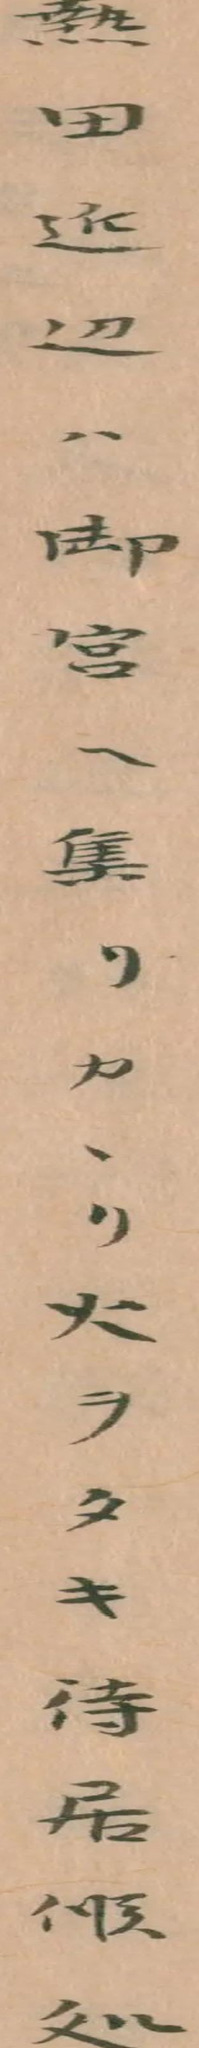熱田近辺ハ御宮へ集りカゝり火ヲタキ待い居候処
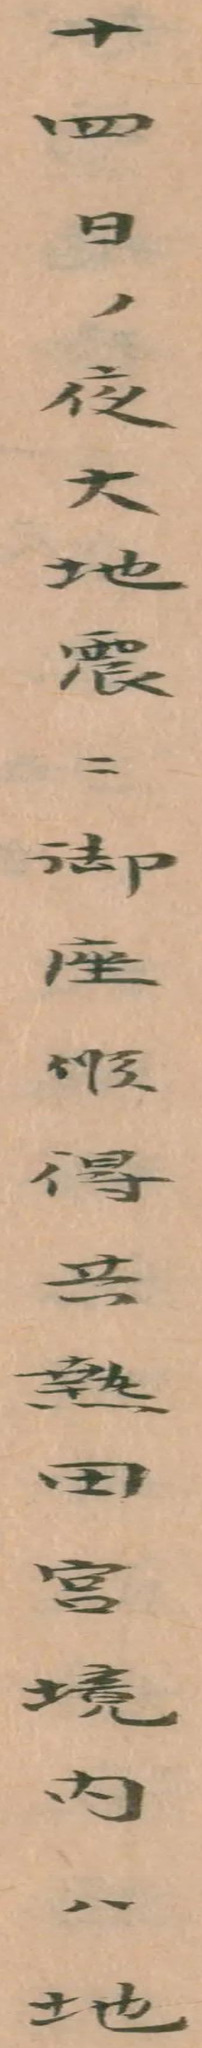十四日ノ夜大地震二御座候得共熱田宮境内ハ地
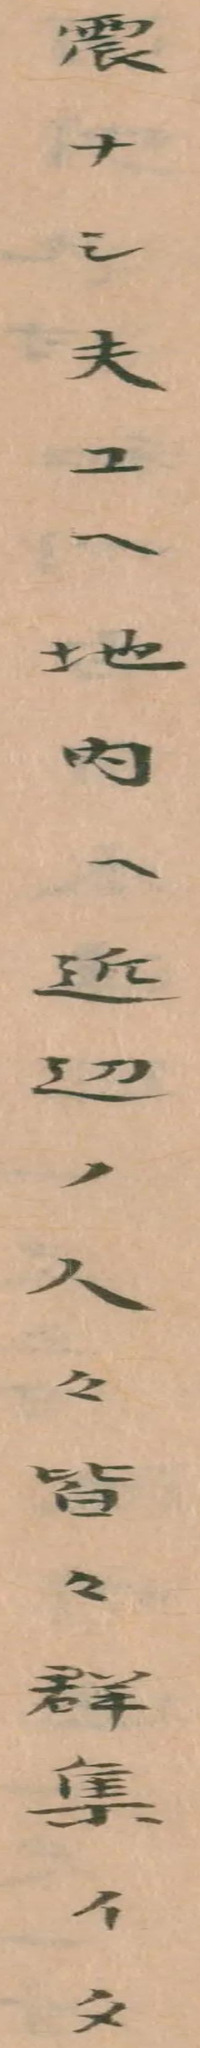震ナシ夫ユヘ地内へ近辺ノ人々皆々群集イタ
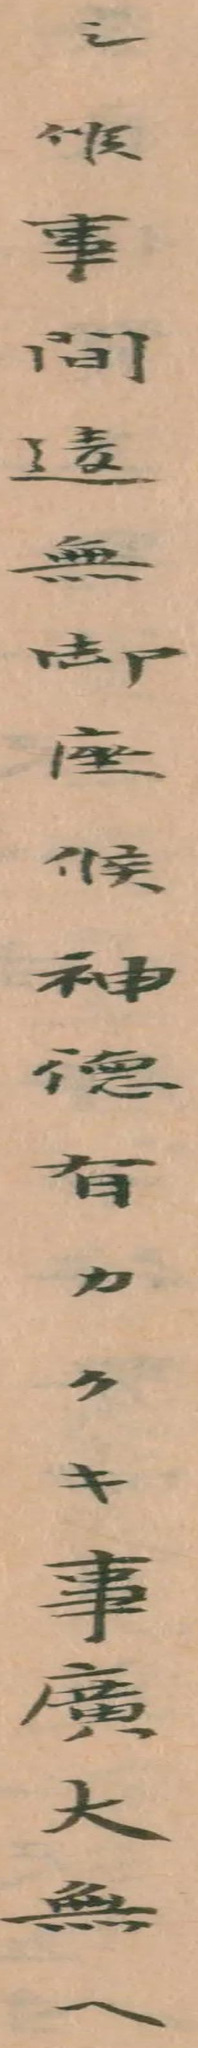シ候事間違無御座候神徳有カタキ事広大無ヘ
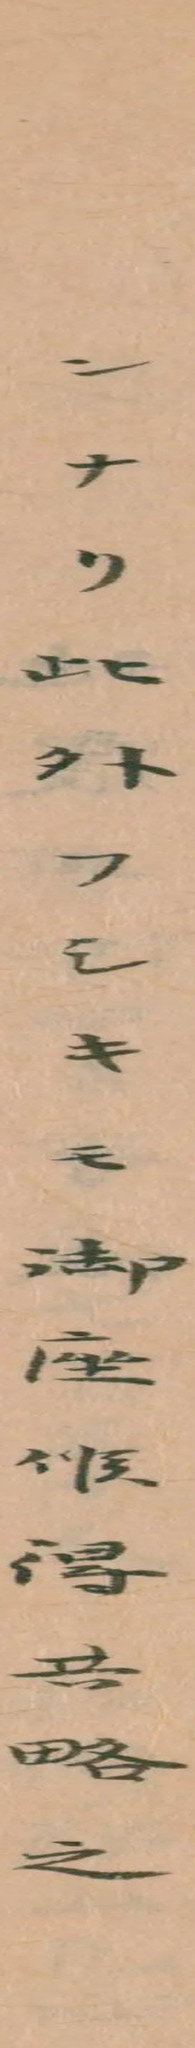ンナリ此外フシキモ御座候得共畧之
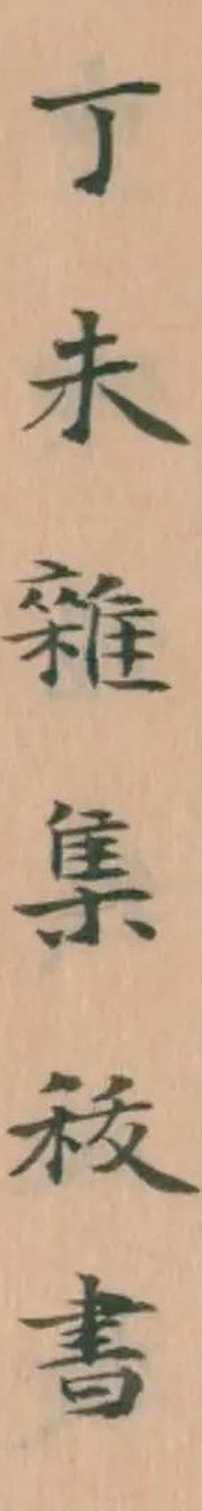丁未雑集抜書
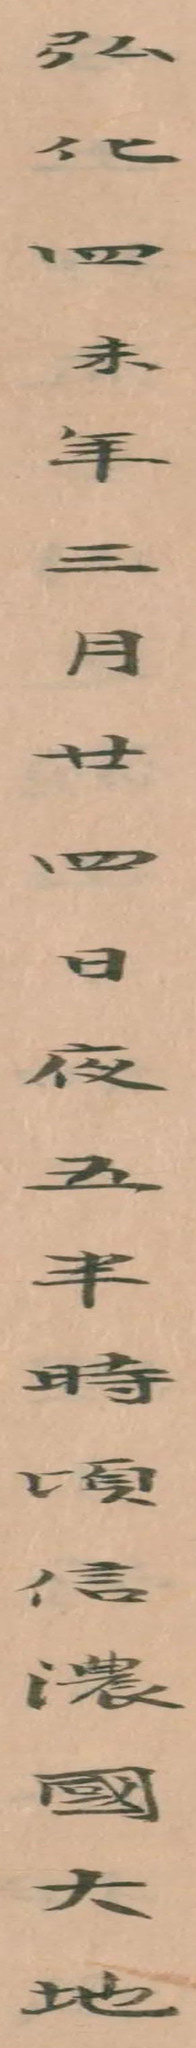弘化四未年三月廿四日夜五半時頃信濃国大地
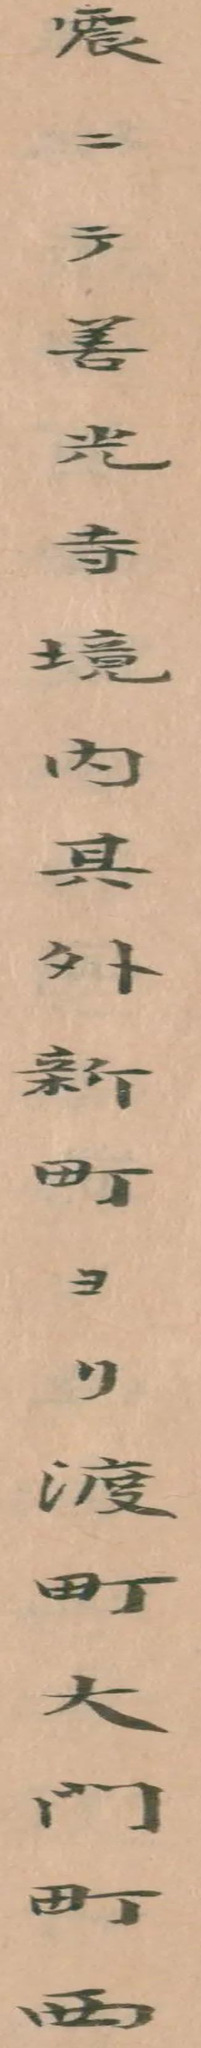震ニテ善光寺境内其外新町ヨリ渡町大門町西
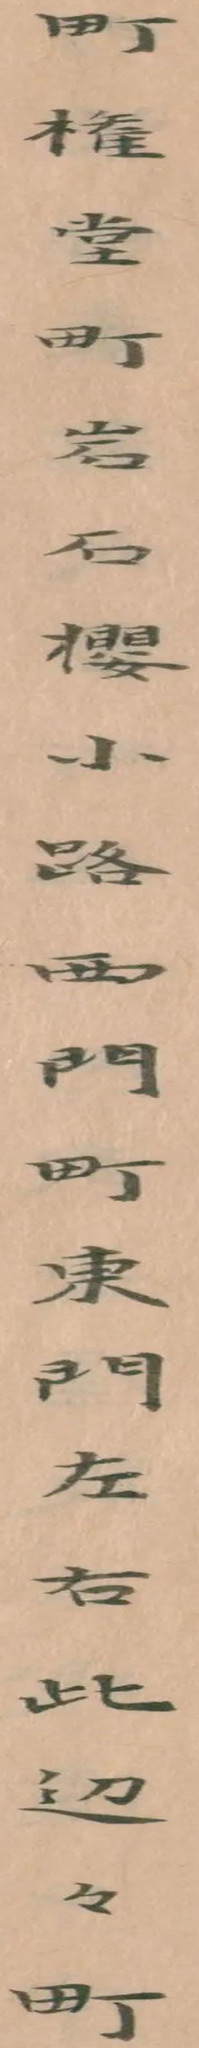町権藤町岩石桜小路西門町東門左右此辺々町
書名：地災撮要. 巻1(噴火山・地震ノ部)
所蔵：国立国会図書館 National Diet Library, JAPAN
